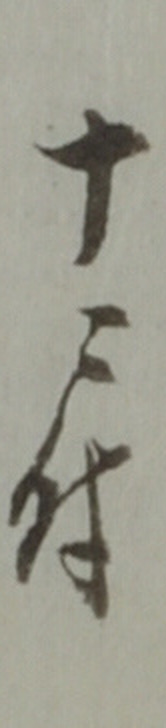十ニ付
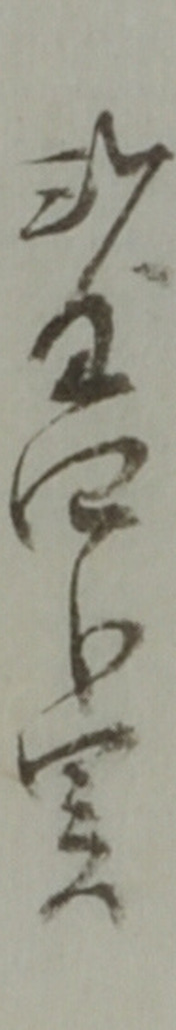三匁四分売

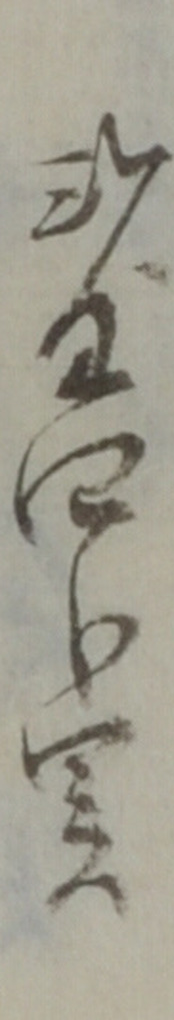弐匁四分売
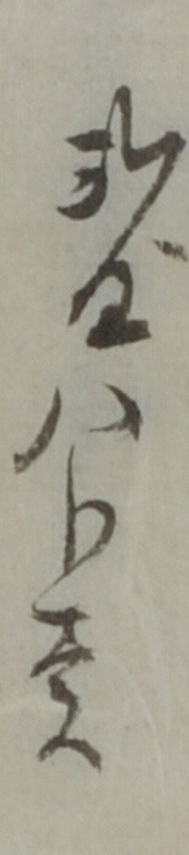弐匁四分売
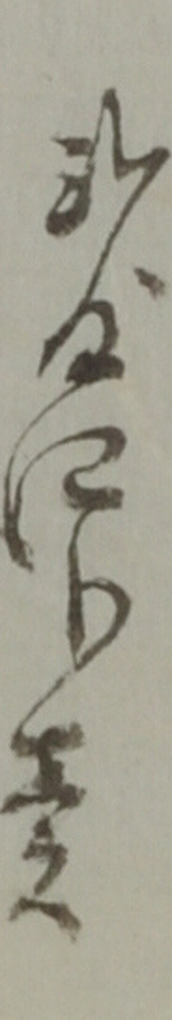弐匁四分売
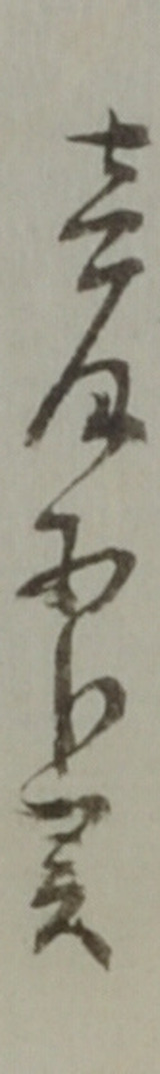壱匁九分売
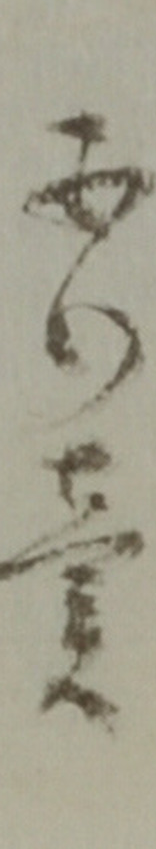五つ売
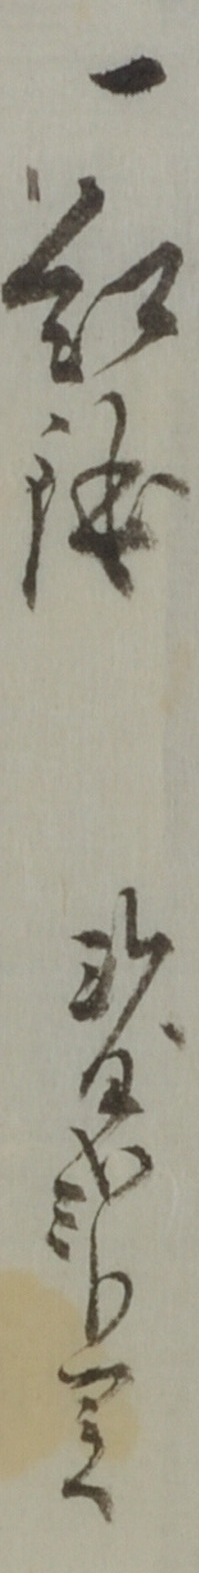一紅鉢弐匁弐分買
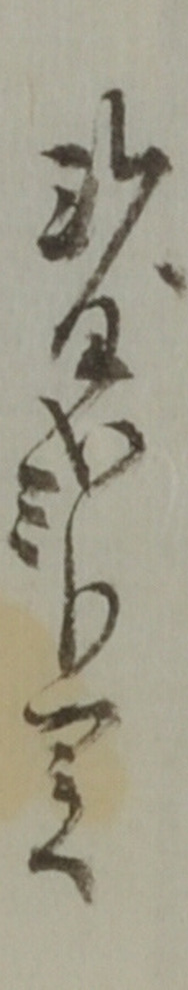弐匁四分売
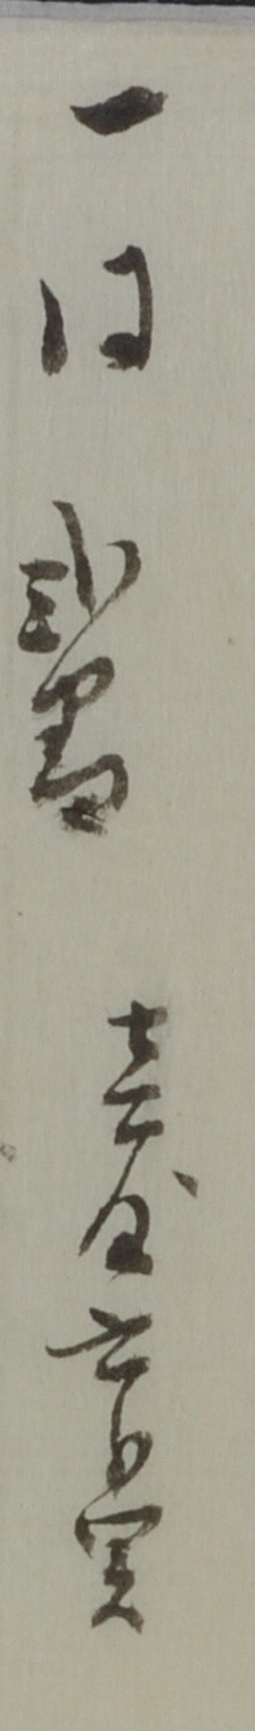一同弐番壱匁六分買
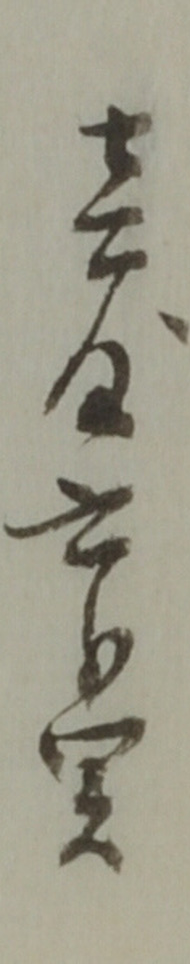壱匁九分売
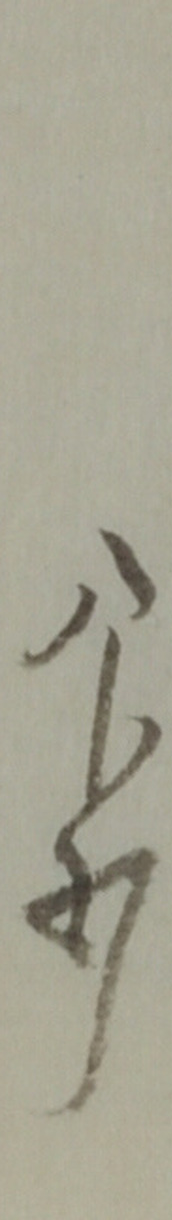八分五厘
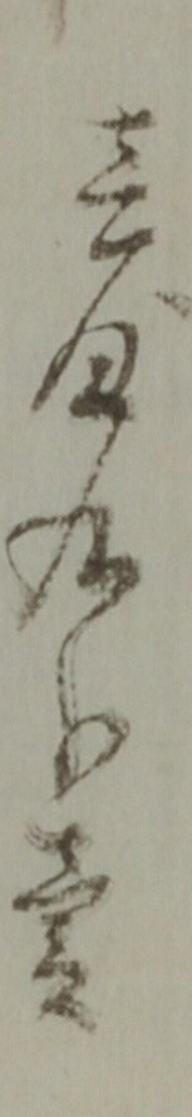壱匁九分売
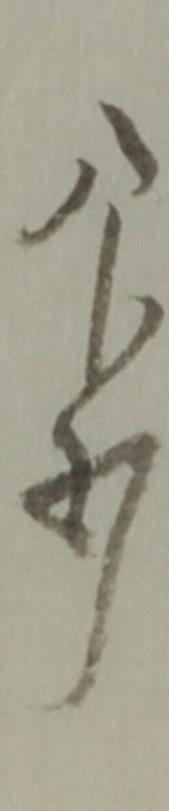八分五厘
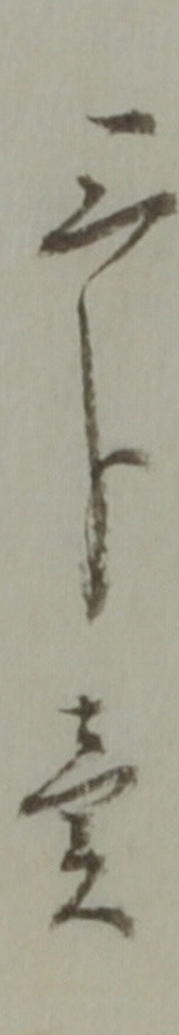三分売
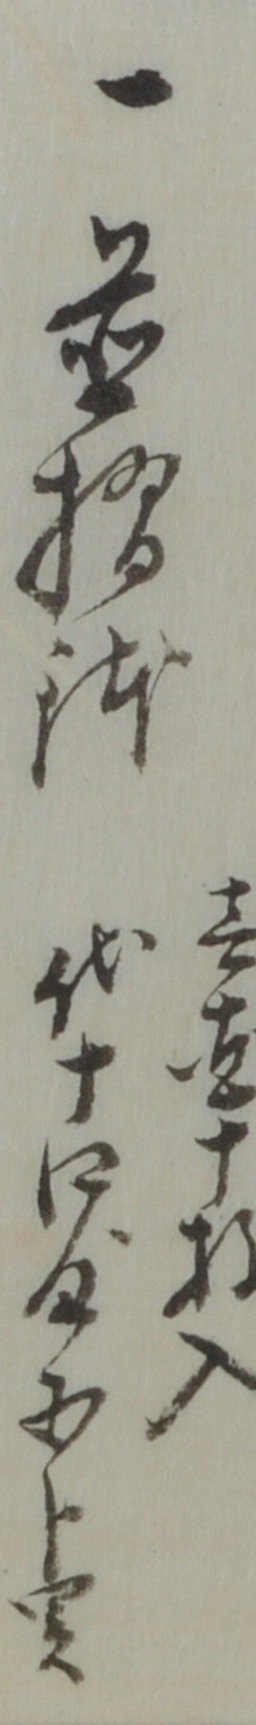一並摺鉢代十四匁五分買
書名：諸色當時直段書上帳扣
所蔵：伊那市立高遠町図書館・合同会社AMANE
